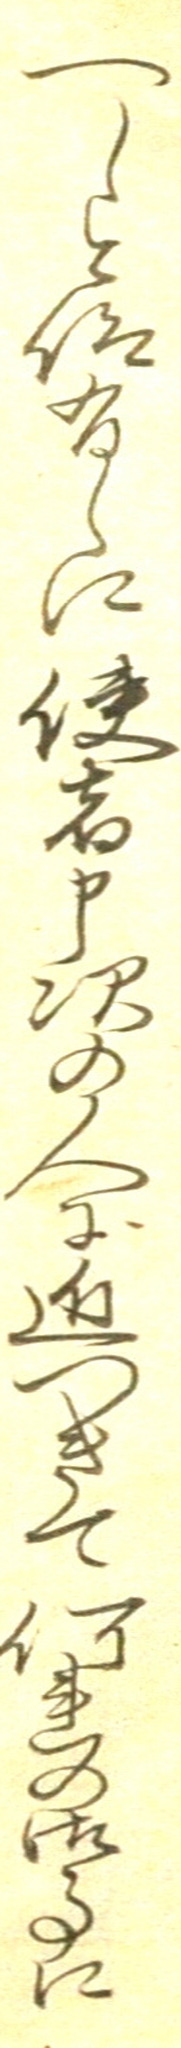へしと仰有しに使者申次の人に近つきて何れの御事に
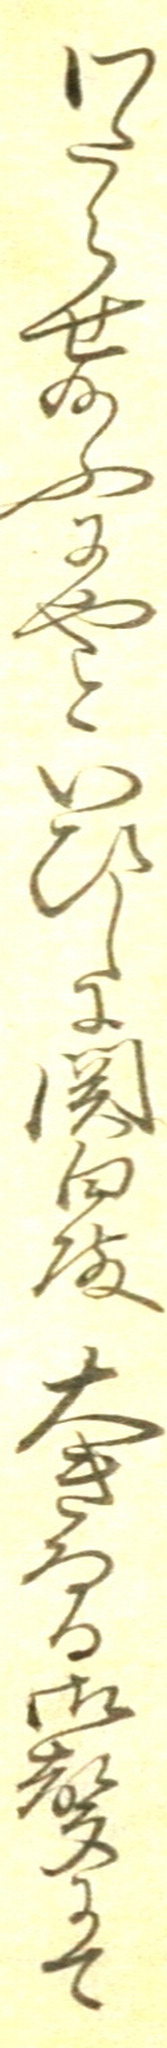わたらせ給ふにやといひしに関白殿大きなる御声にて
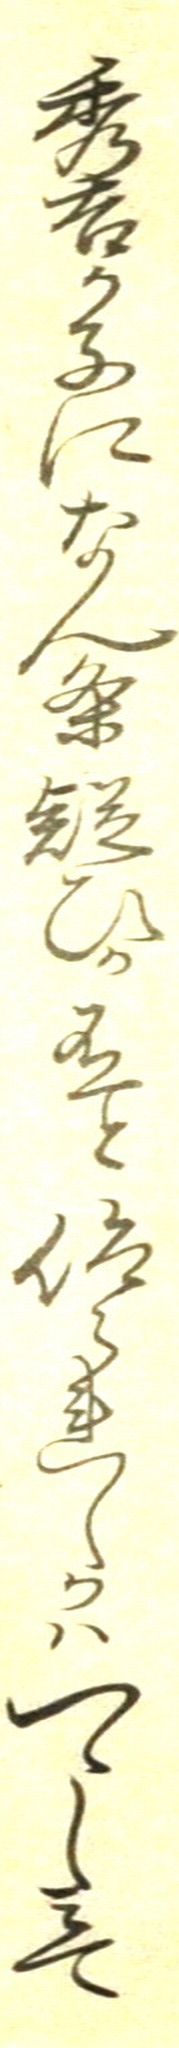秀吉か子になん条疑ひか有と仰られしかはつゝしみて
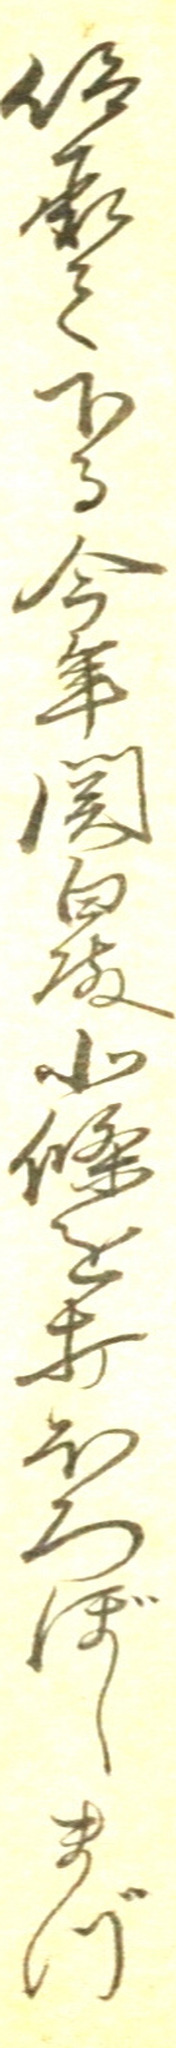仰承て下る今年関白殿北条を打ほろぼしまづ
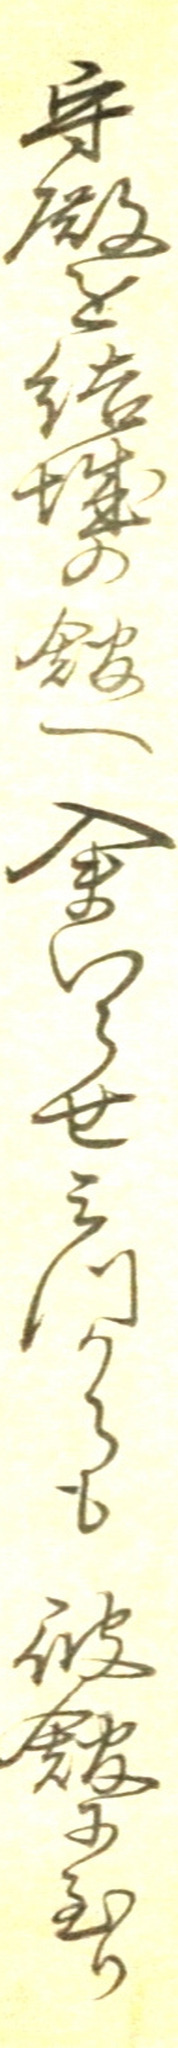守殿を結城の館へ入まいらせみつからも彼館に至り
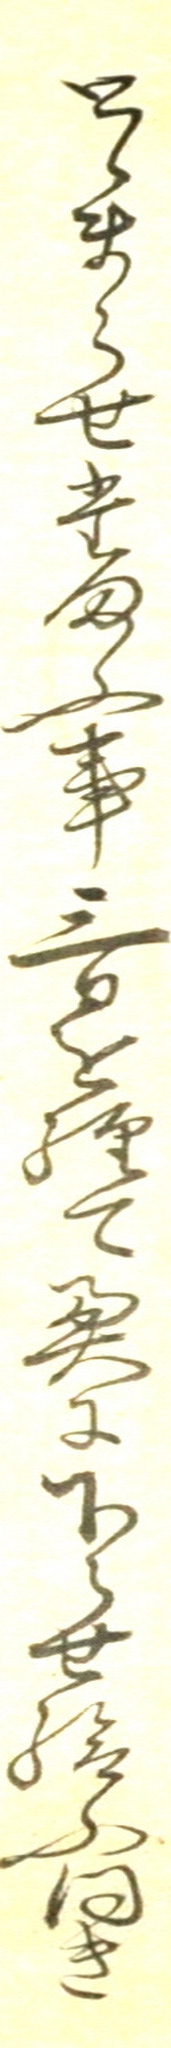とゝまらせたまふ事三日を経て奥に下らせ給ふ同き
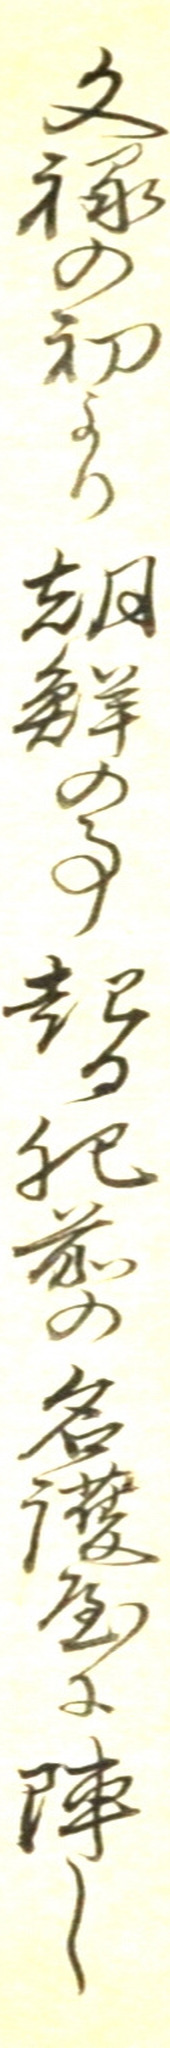文禄の初より朝鮮の事起る肥前の名護屋に陣し
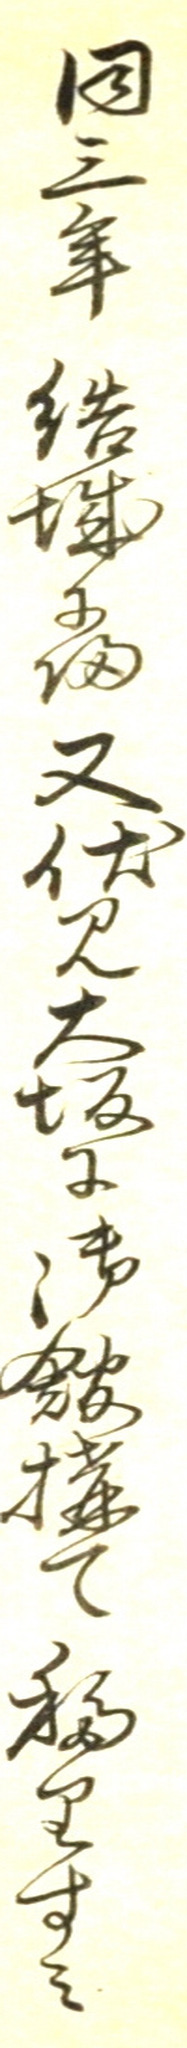同三年結城に帰又伏見大坂に御館構て移りすみ
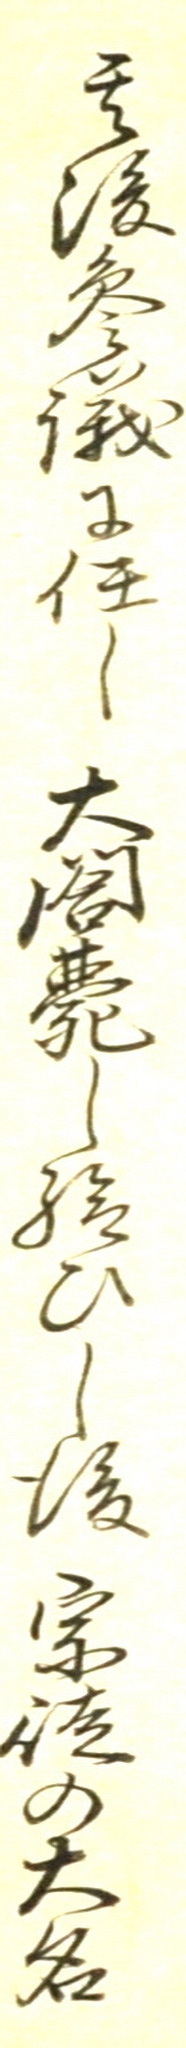其後参議に任し太閤薨し給ひし後宗徒の大名
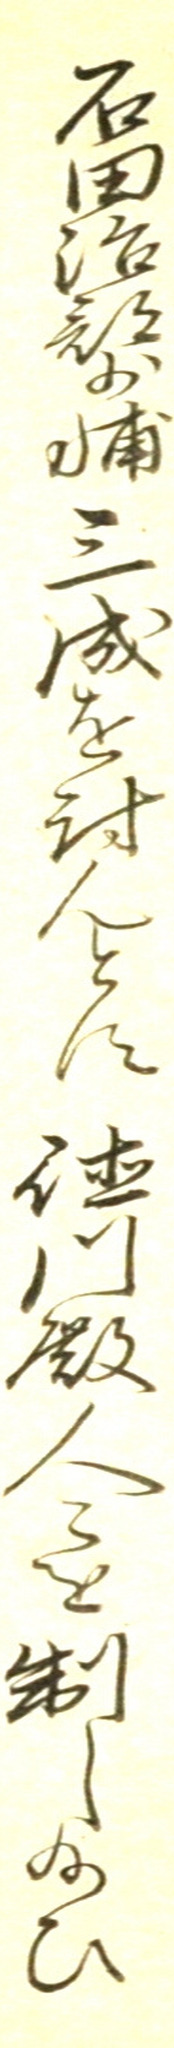石田治部少輔三成を討んとす徳川殿人々を制し給ひ
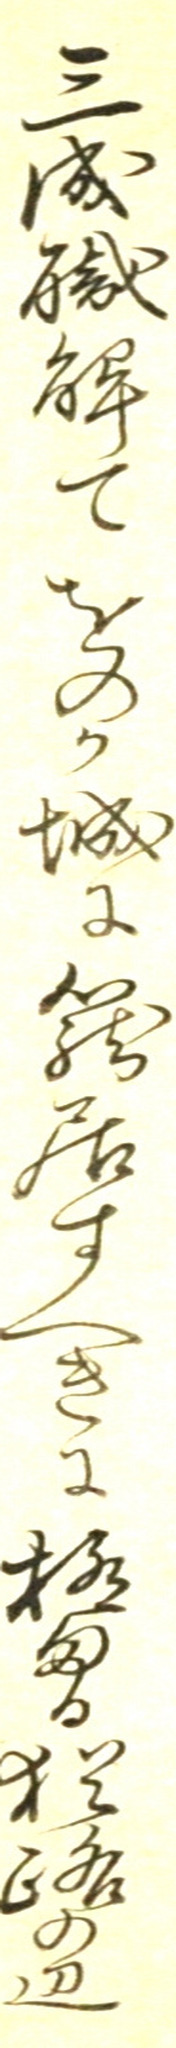三成職解てをのか城に籠居すへきに極まる猶路の辺
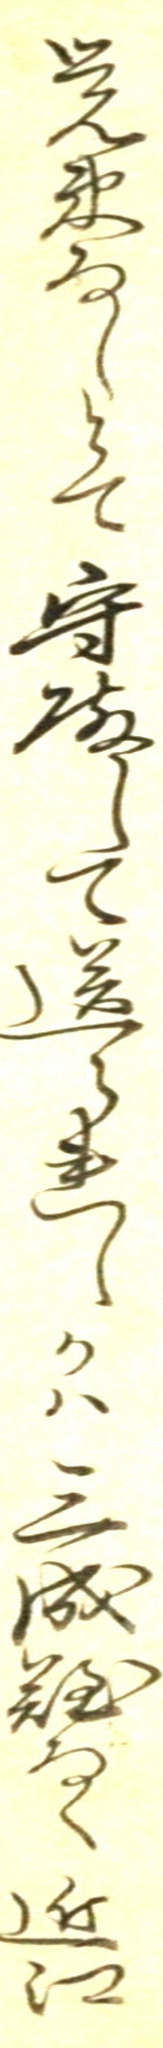覚束なしとて守殿して送られしかは三成難なく近江
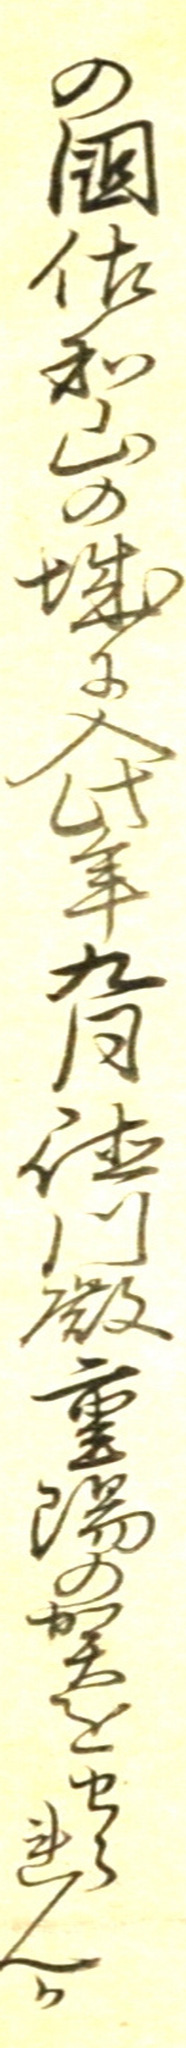の国佐和山の城に入此年九月徳川殿重陽の賀をせられんか
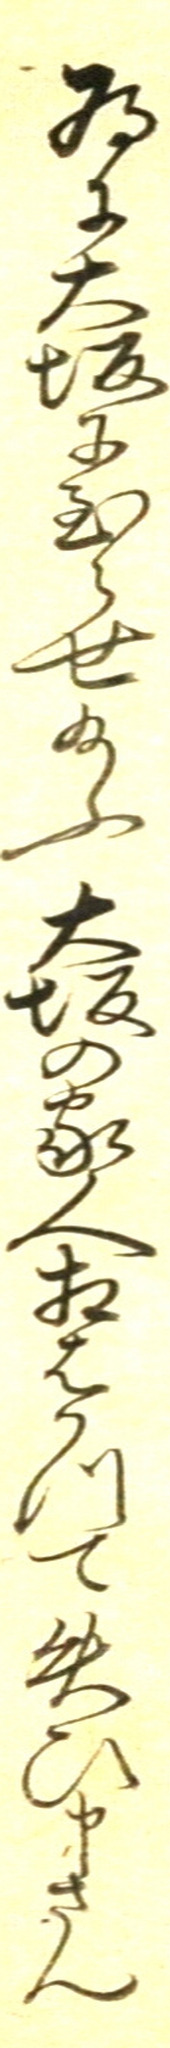為に大坂に至らせ給ふ大坂の家人相はかつて失ひ申さん
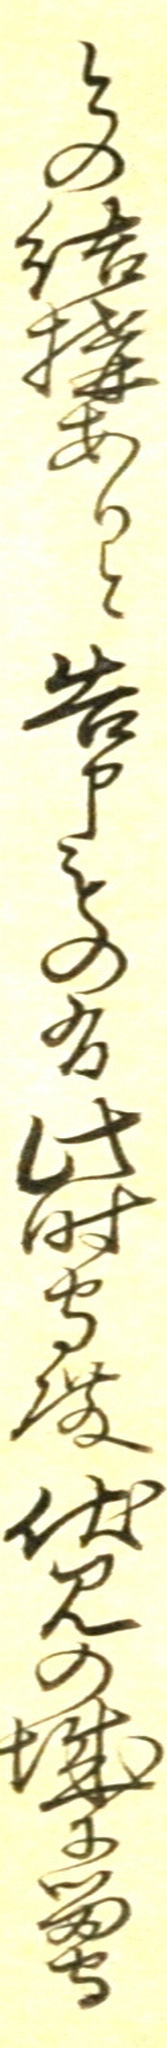との結構ありと告申もの有此時守殿伏見の城に留守
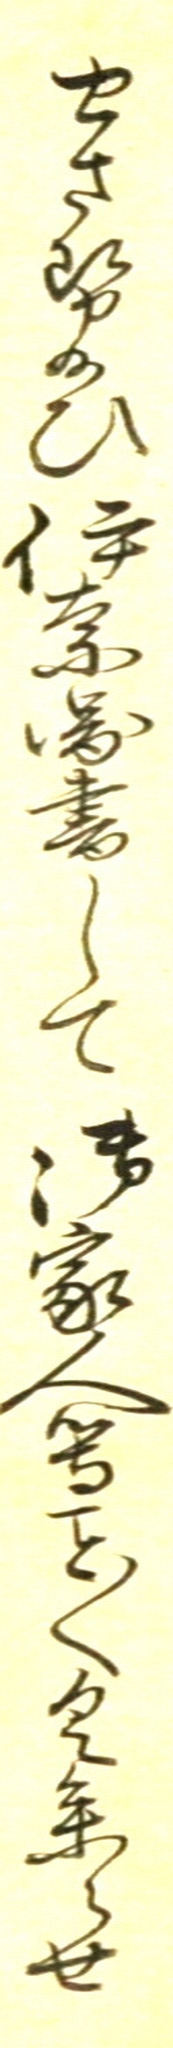せさせ給ひ伊奈図書して御家人等こと〳〵く参らせ
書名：藩翰譜（一）
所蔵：伊那市立高遠町図書館・合同会社AMANE
